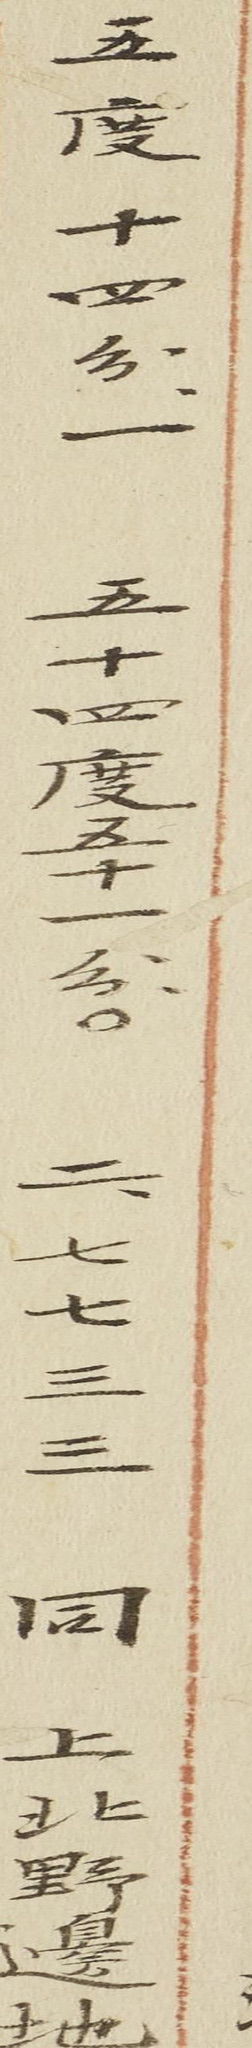五度十四分、一五十四度五十一分、〇二、七七三三同上北野辺地
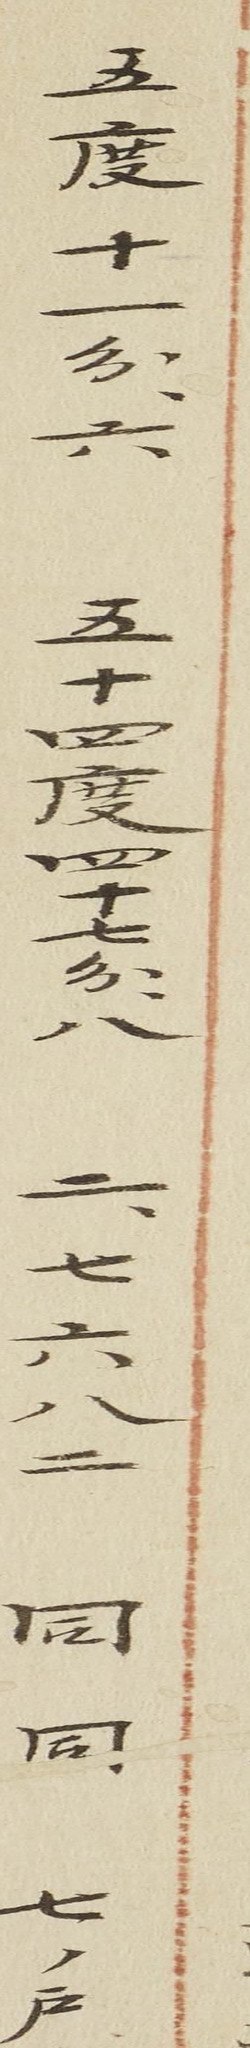五度十一分、六五十四度四十七分、八二、七六八二同同七ノ戸
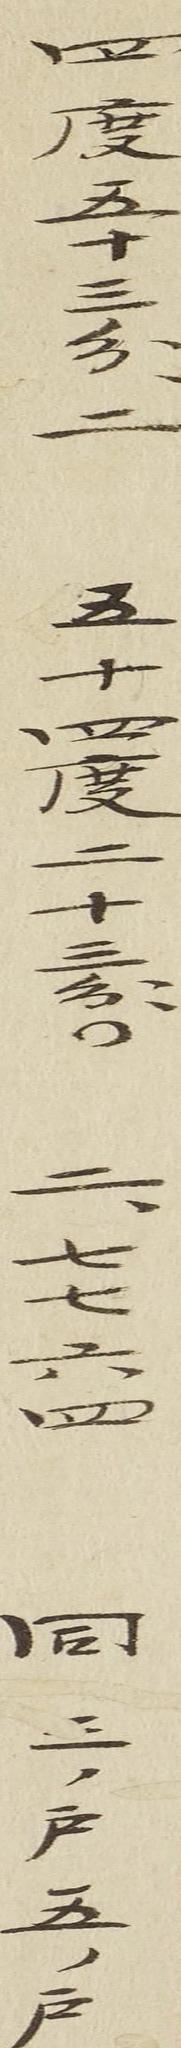四度五十三分、二五十四度二十三分、〇二、七七六四同三ノ戸五ノ戸
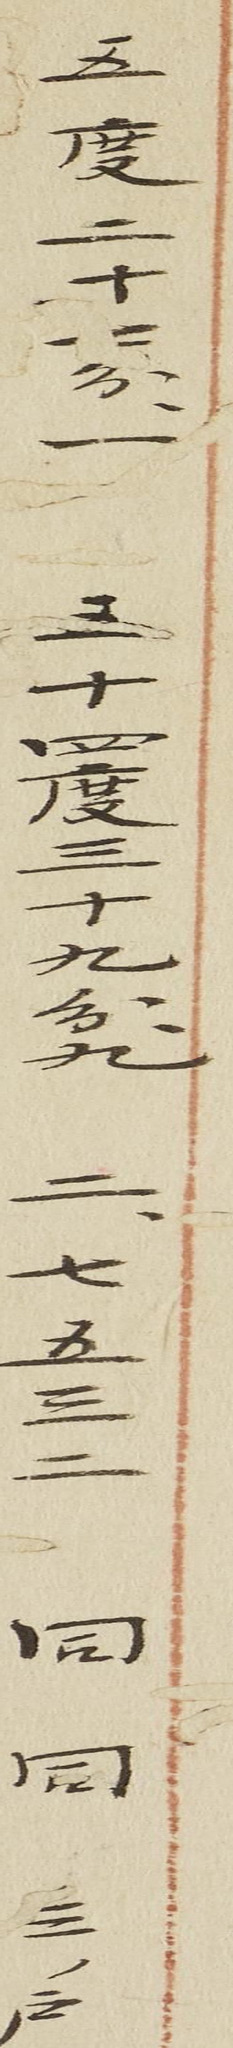五度二十七分、一五十四度三十九分、九二、七五三三同同三ノ戸

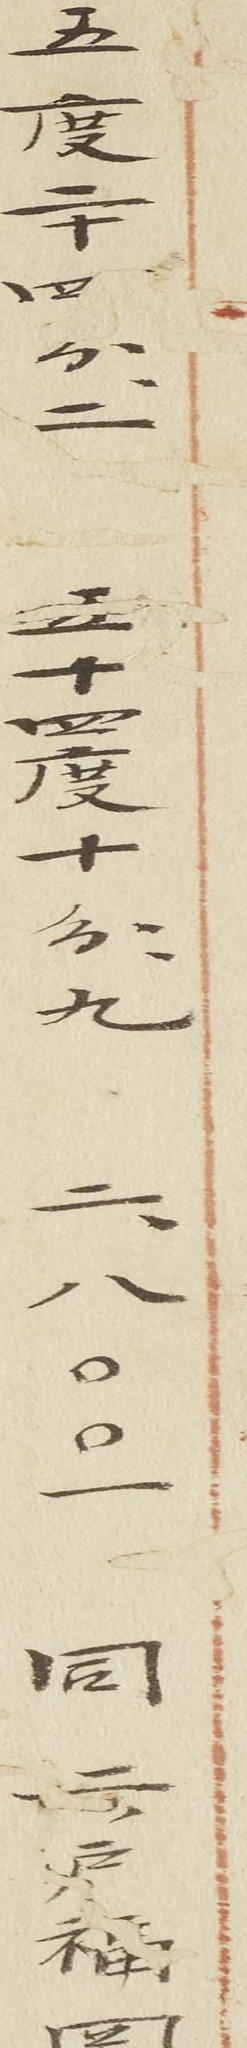五度二十四分、二五十四度十分、九二、八〇〇一同二ノ戸福岡
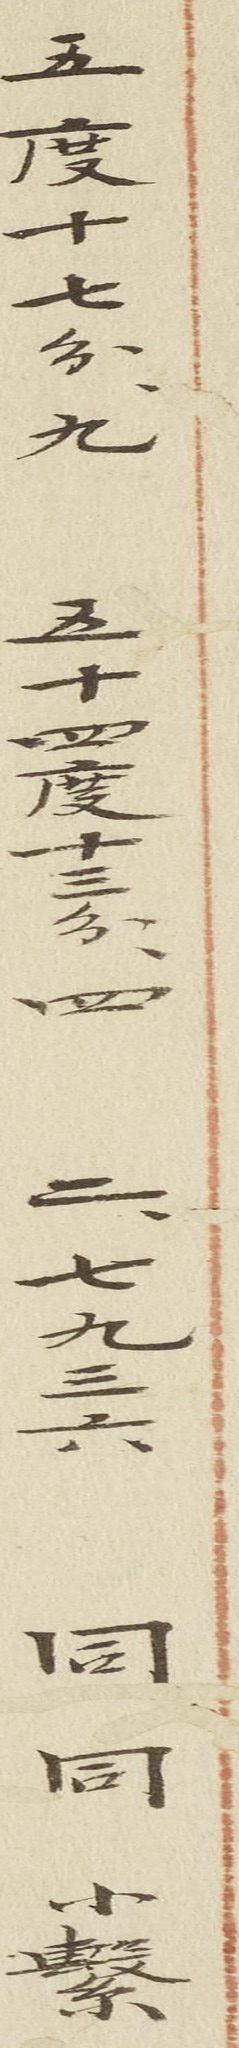五度十七分、九五十四度十三分、四二、七九三六同同小繋
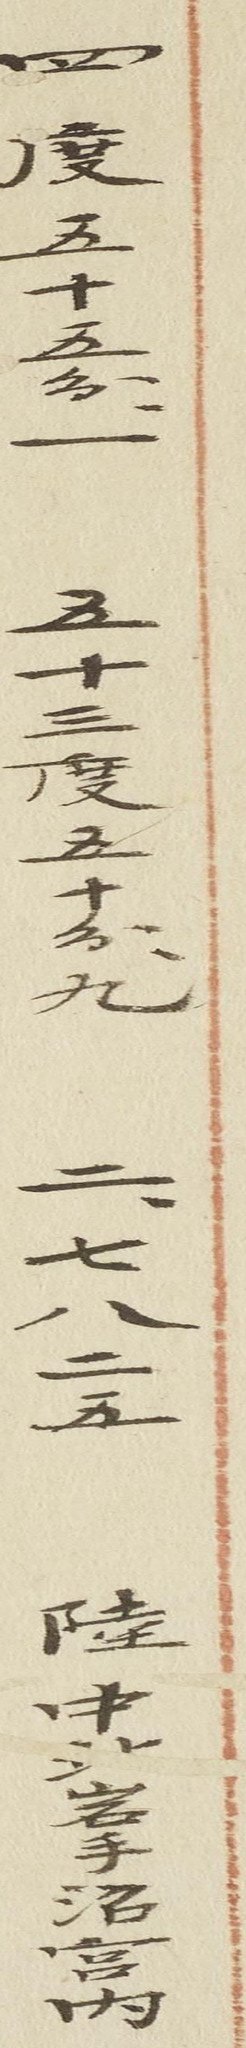四度五十五分、一五十三度五十分、九二、七八二五睦中北岩手沼宮内
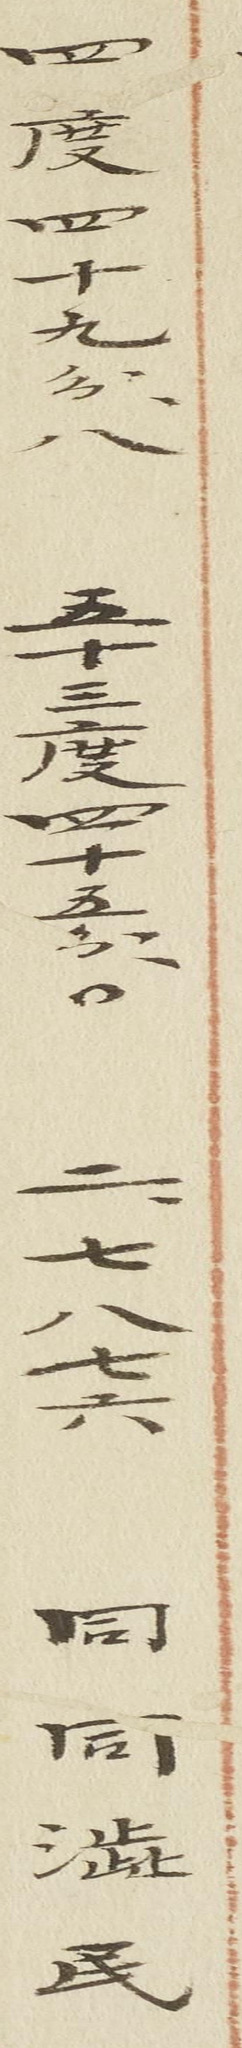四度四十九分、八五十三度四十五分、〇二、七八七八同同渋民
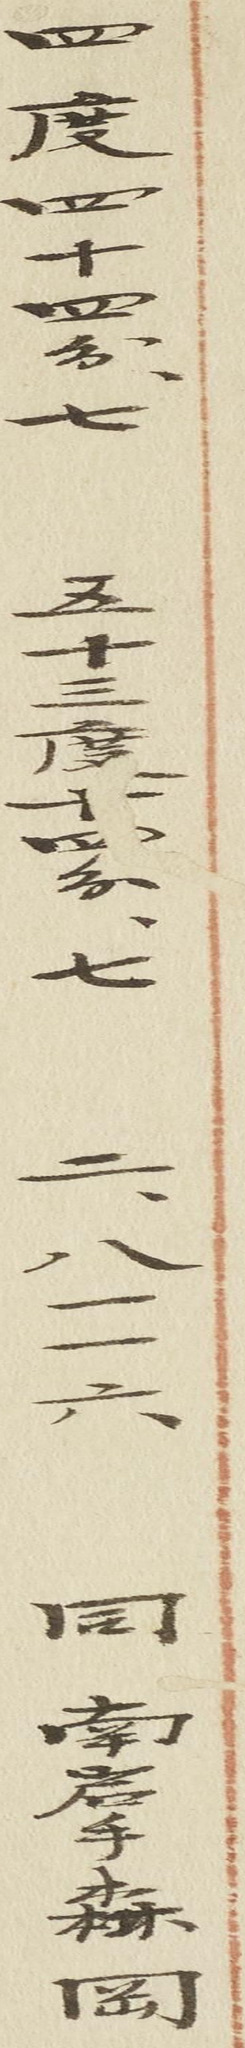四度四十四分、七五十三度十四分、七二、八一一六同南岩手森岡
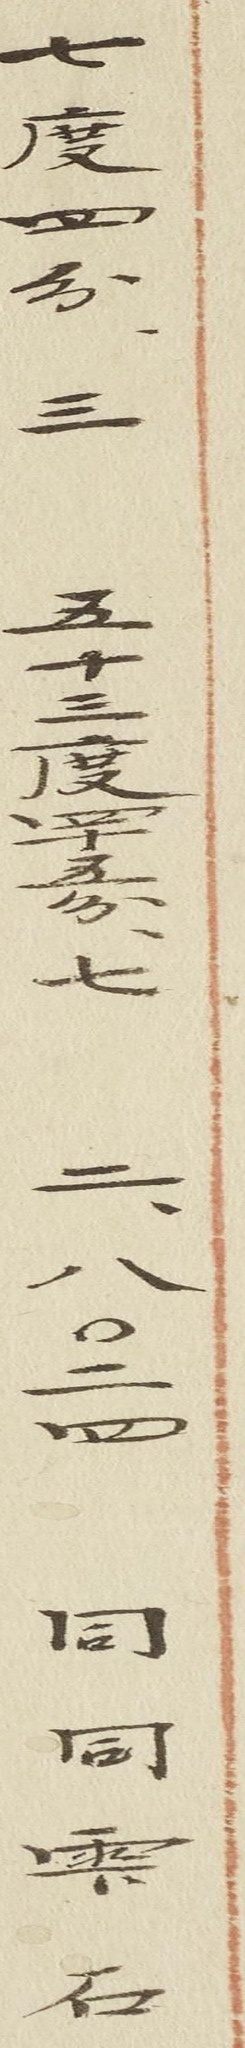七度四分、三五十三度四十五分、七二、八〇二四同同雫石
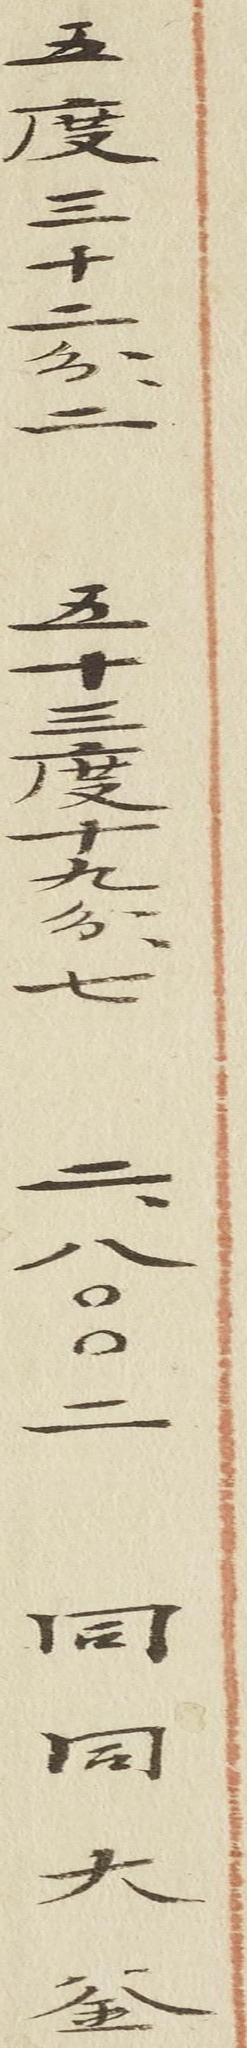五度三十二分、二五十三度十九分、七二、八〇〇二同同大釜
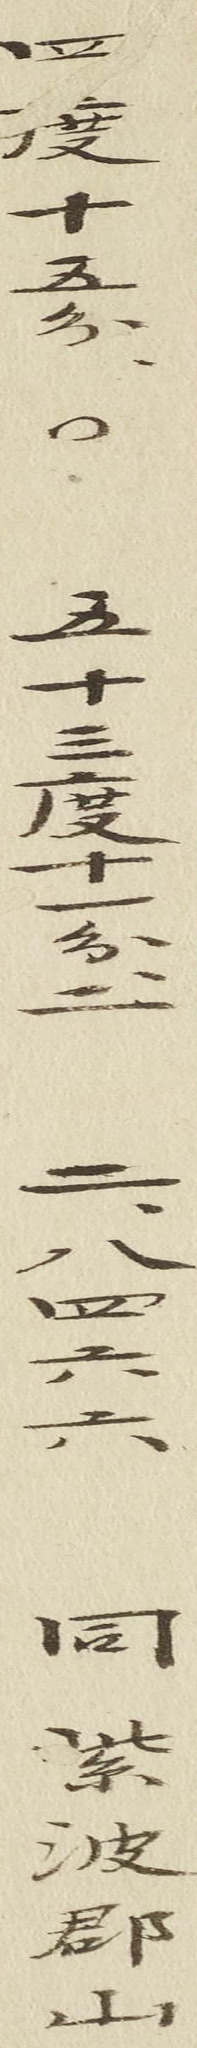四度十五分、〇五十三度十一分、二二、八四六六同紫波郡山
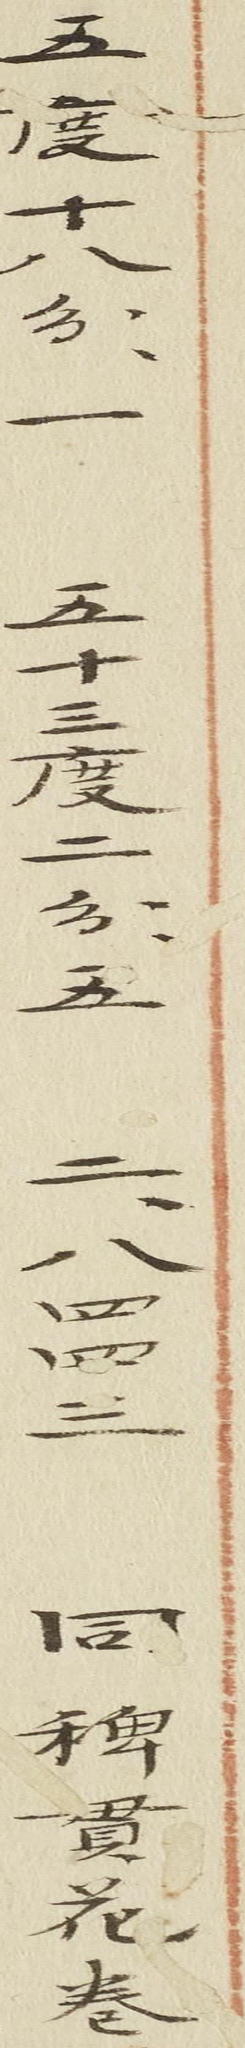五度十八分、一五十三度二分、五二、八四四三同稗貫花巻
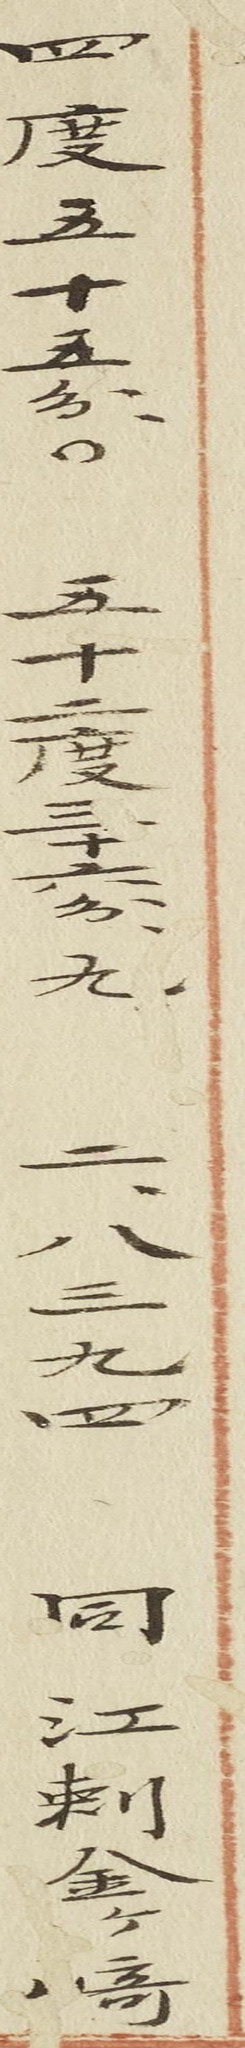四度五十五分、〇五十二度三十六分、九二、八三九四同江尻金ヶ崎
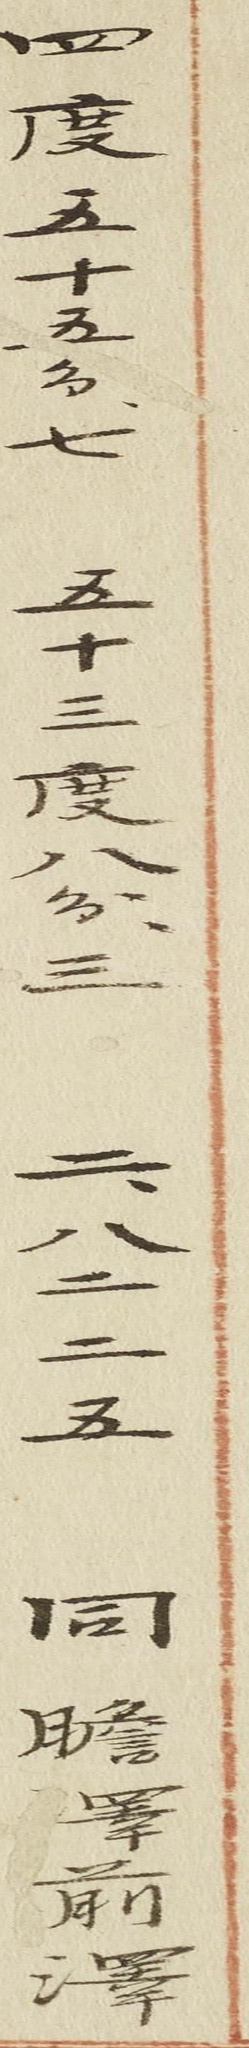四度五十五分、七五十二度八分、三二、八二二五同胆沢前沢
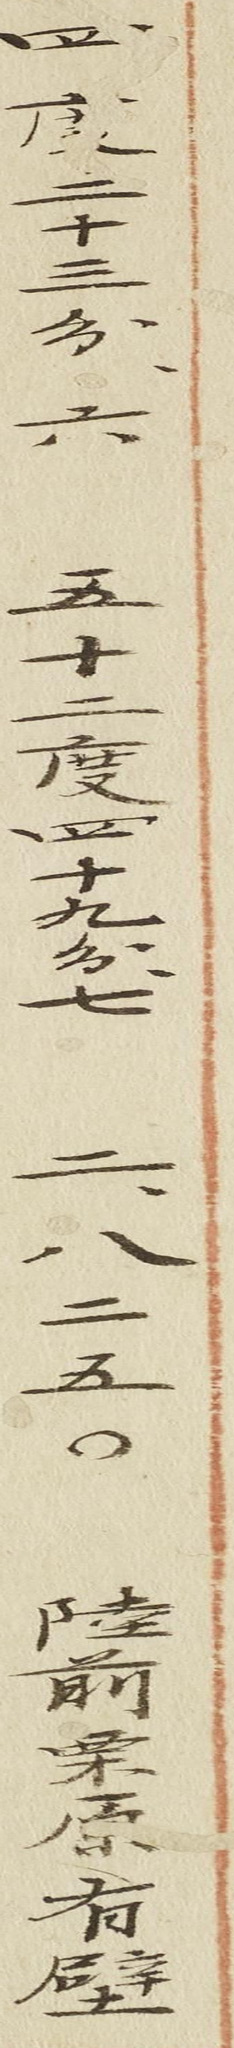四度二十三分、六五十二度四十九分、七二、八二五〇陸前栗原有壁
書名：鑷力観測報告
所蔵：東京大学地震研究所図書室 Earthquake Research Institute Library, The University of Tokyo, JAPAN
